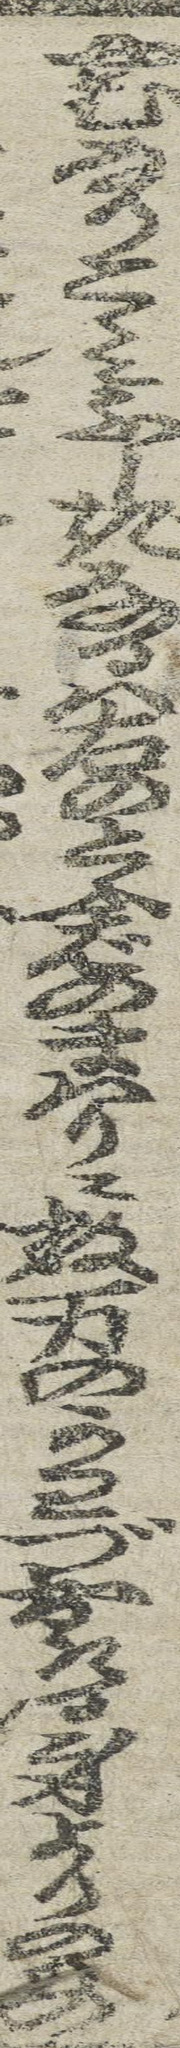やむなりこゝニふしぎなるは右のとふばのまはりに数万のかわづおける身よりのもの
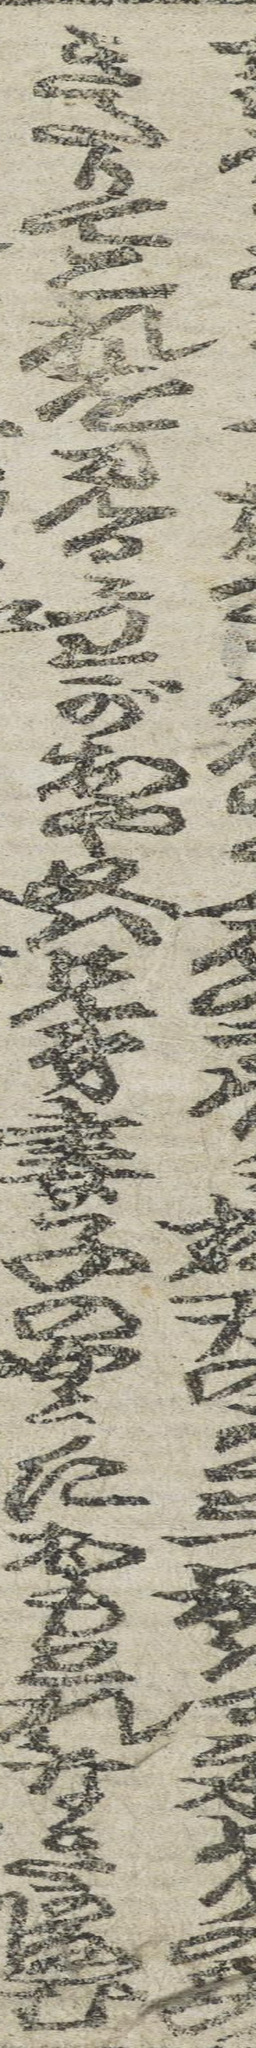きたりてこれを見るにわがおや又は兄弟妻子のやうにおもわれなきかなしむ
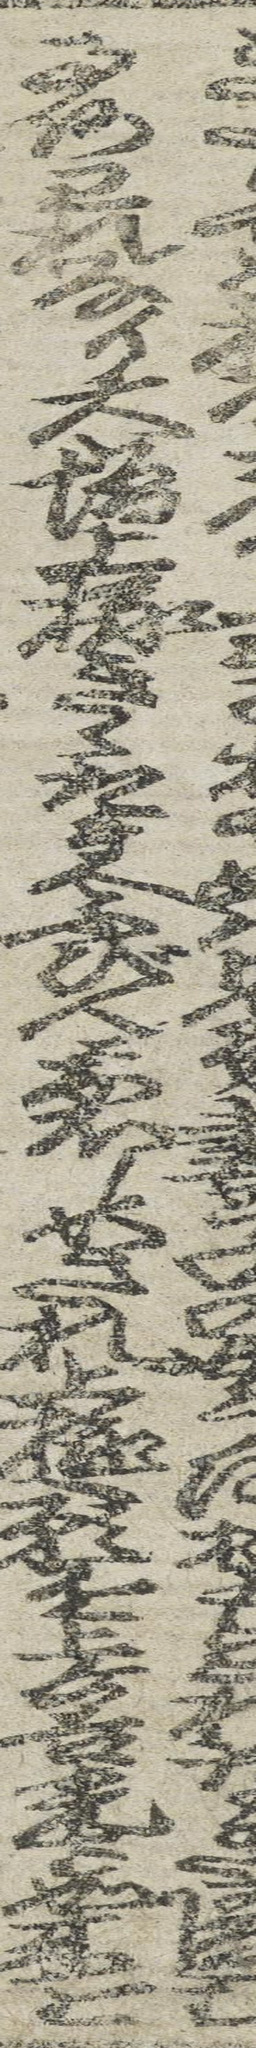事あわれなり大増上様きたまへふびんにおほしめされ上様へ願を上ケ善光如来を
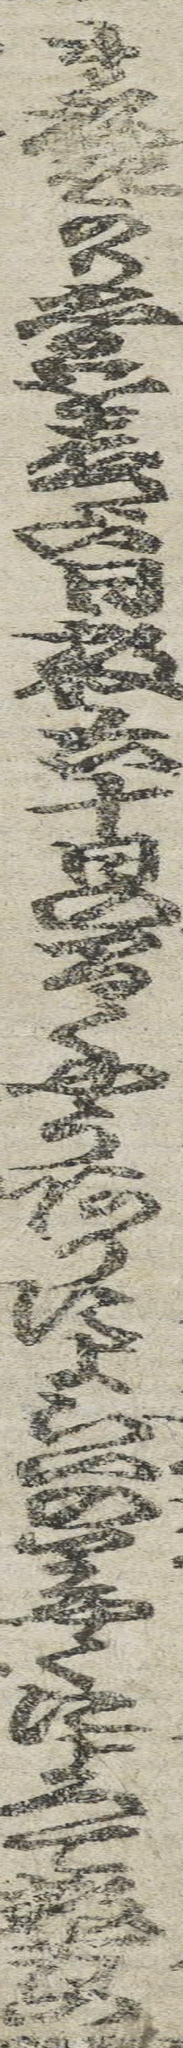まねきかり営をしつらい日数六十日の間くやうありによらいのりやくによつて数万の
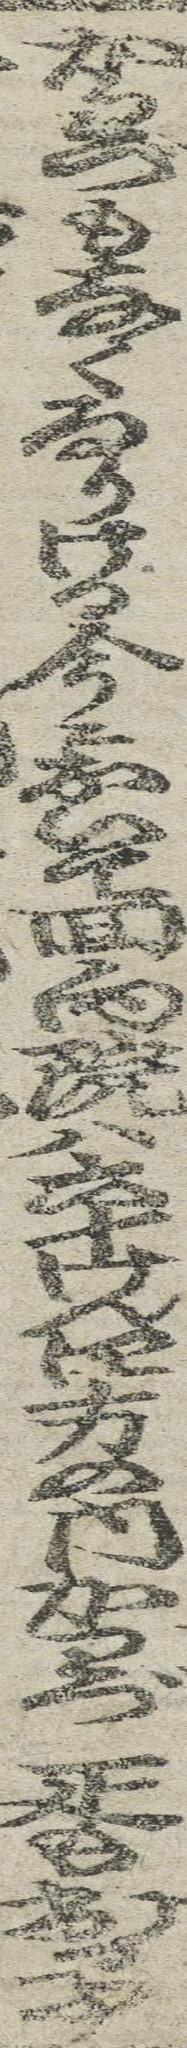かわづもなくなりける今において回向院は六十けん四方の内かわづ疋も出る事
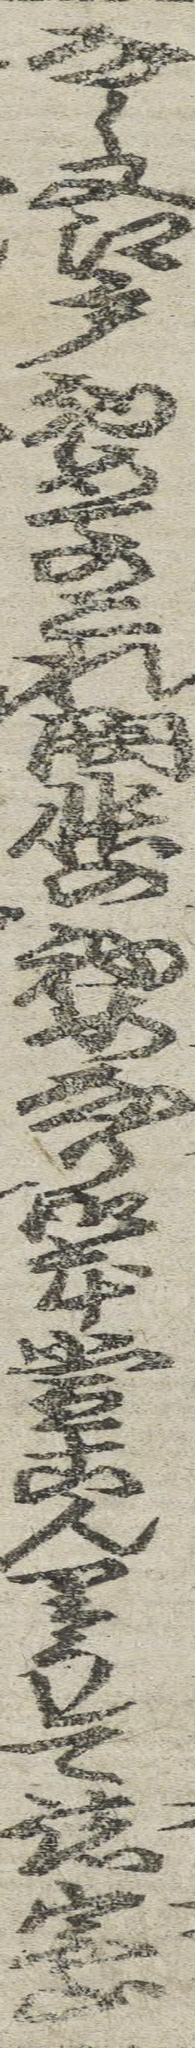なし又江戸初めてのこれ開帳の初めなり御本堂こんりうして諸宗山
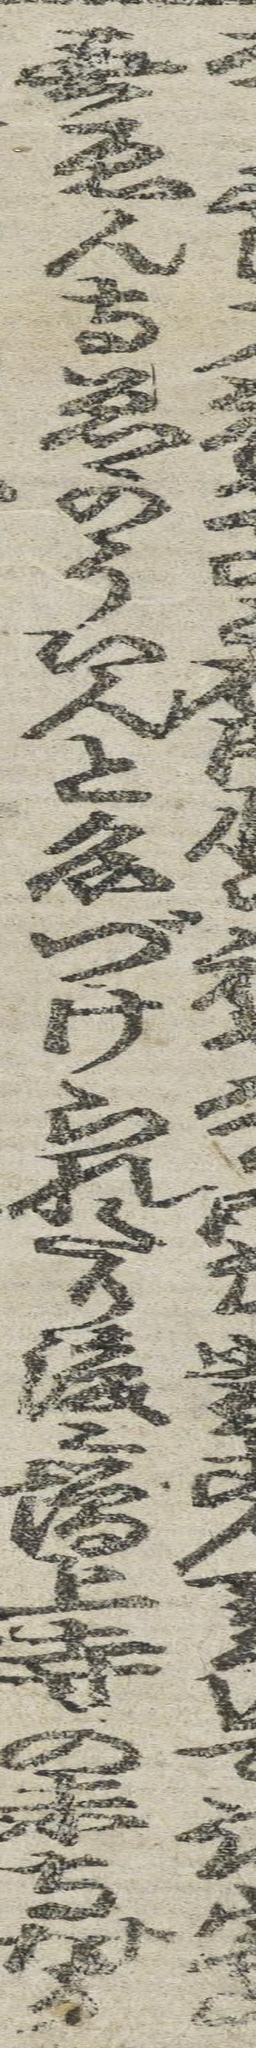無ゑん寺ゑかういんと名づけられたり後に増上寺の末寺となり
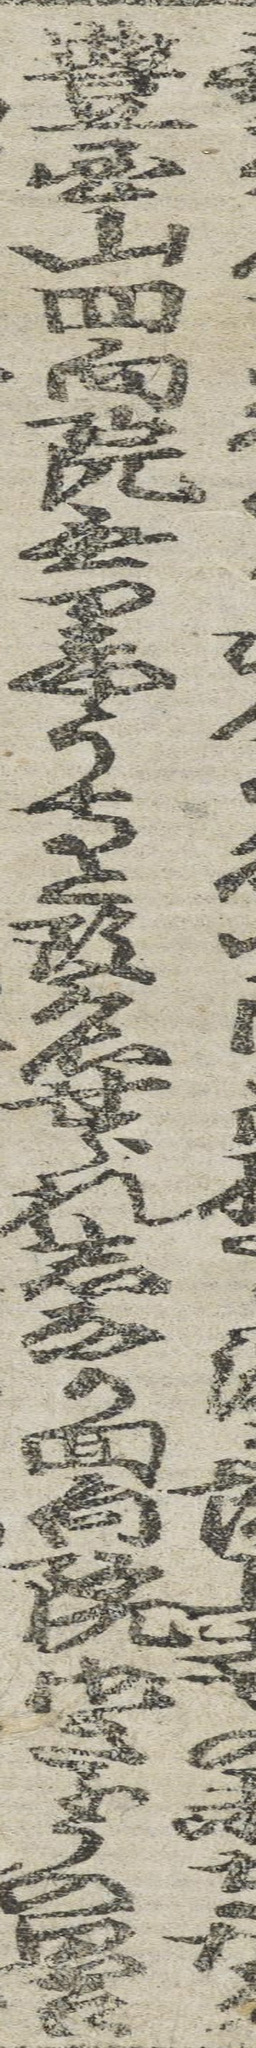豊国山回向院無りやう寺と改名せられしなり回向院御きとうの思召
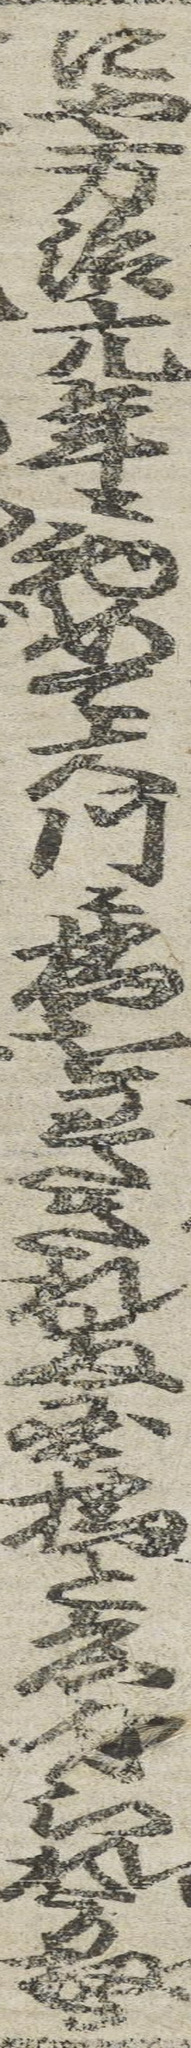にや万治元年に初めて大川に橋をわたされ両国橋と名付られたり扨も
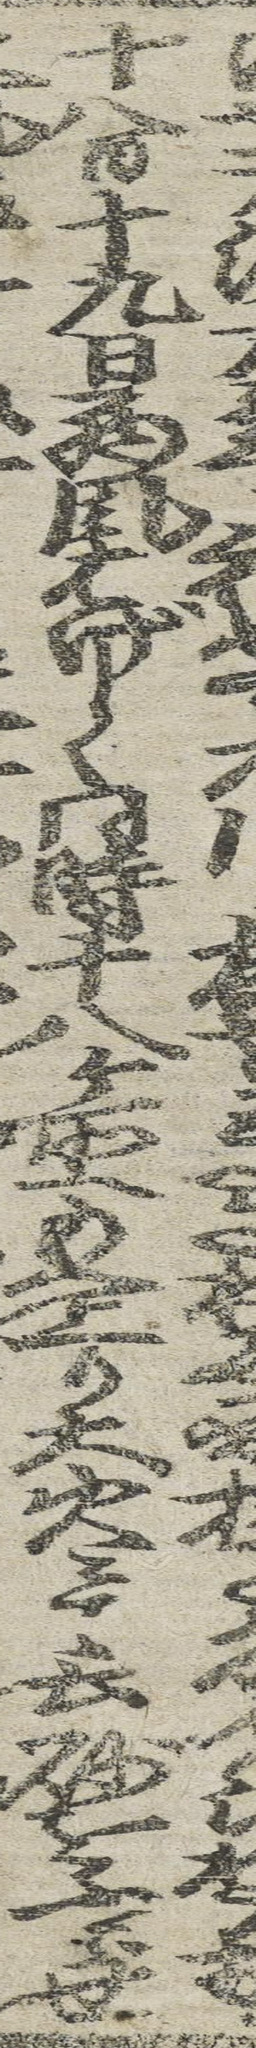十八日十九日西風はげしく同時十八ヶ所へもへ上り大火にて土砂をふらせ
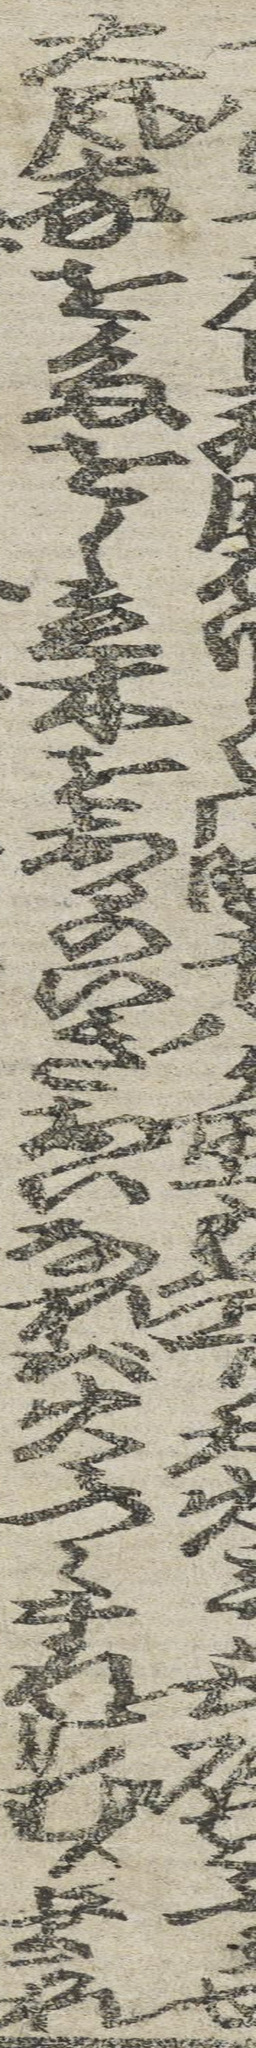大風家をたをし並木をおるのいきおいなれば火につゝまれけむりにまかれ
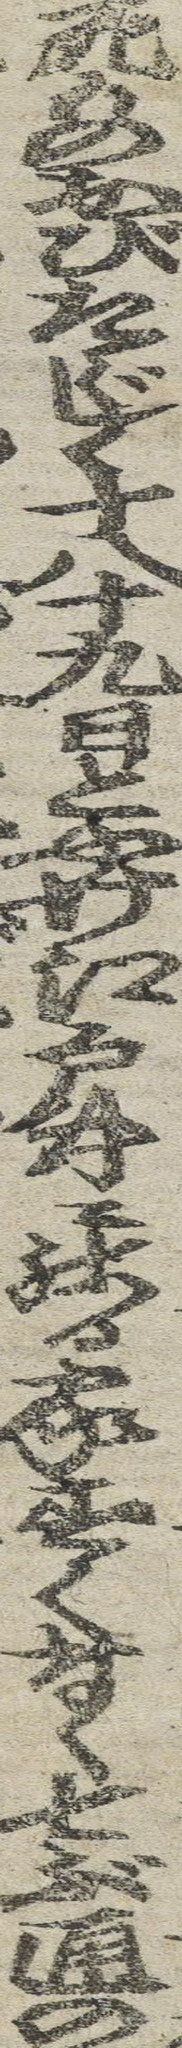死ものおびたゞしく十八十九日とやけ江戸中に残る家すくなく七ぶ通の
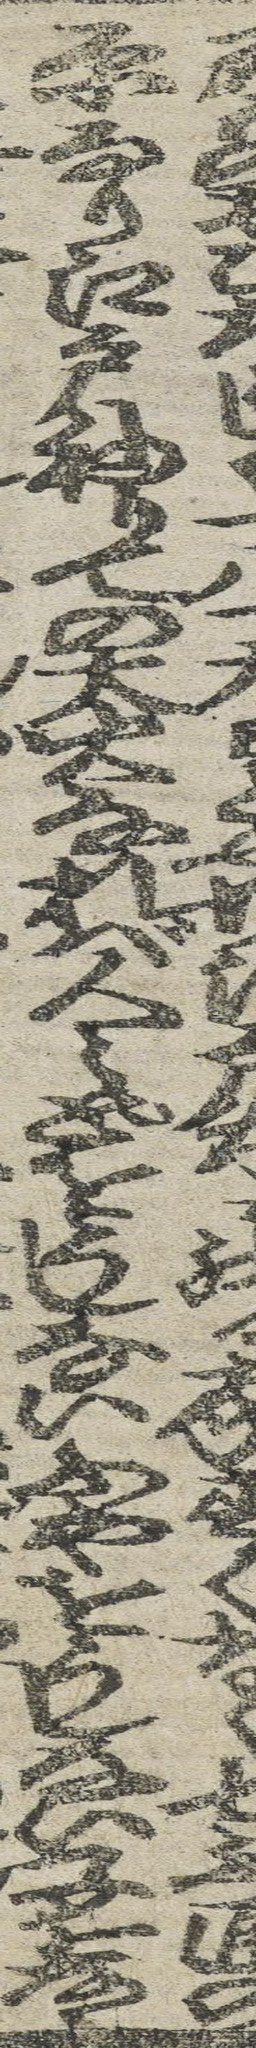原なり江戸初りての大火なれば人〻どをうしないおやをうしない子をなく
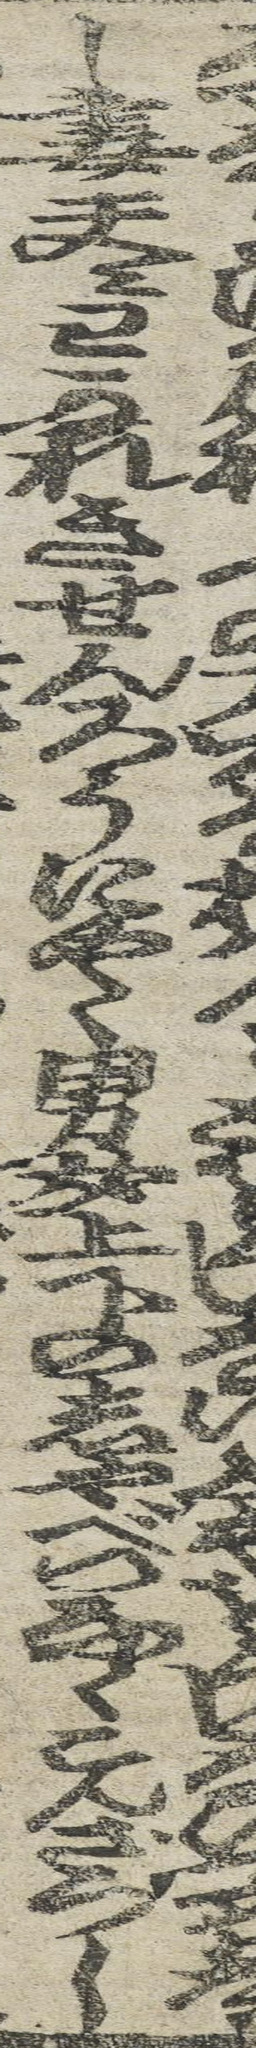し妻夫にわかれきせんろうにやく男女上下のしやべつなくこんざつし
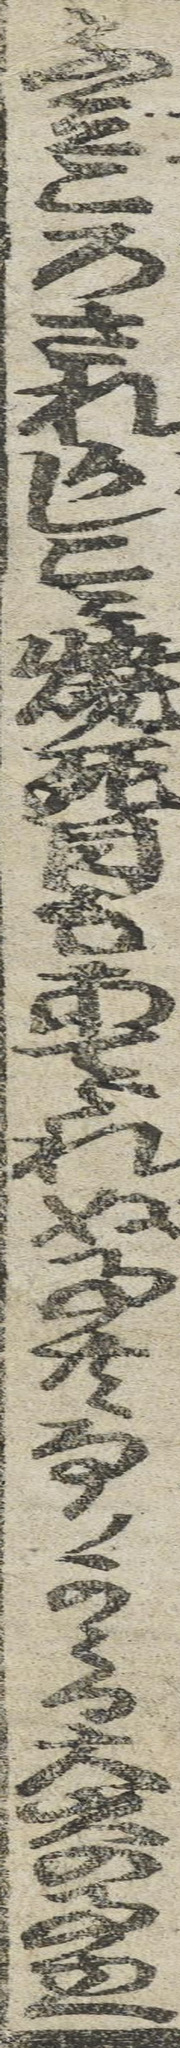ふみころされかしヒに焼死目もあてられぬ事共〻なりかゝる大火の事ゆへ
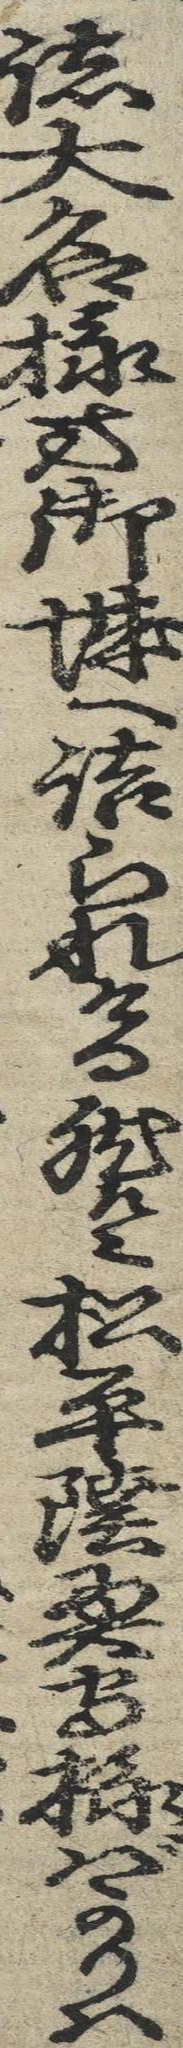諸大名方御城へ詰られける然るに松平陸奥守様ばかりは
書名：[明暦大火に関する冊子]
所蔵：東京大学地震研究所図書室 Earthquake Research Institute Library, The University of Tokyo, JAPAN
